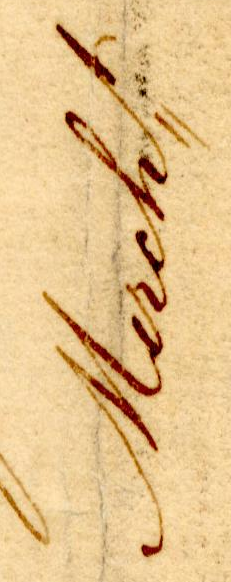Merch^t
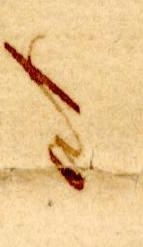at
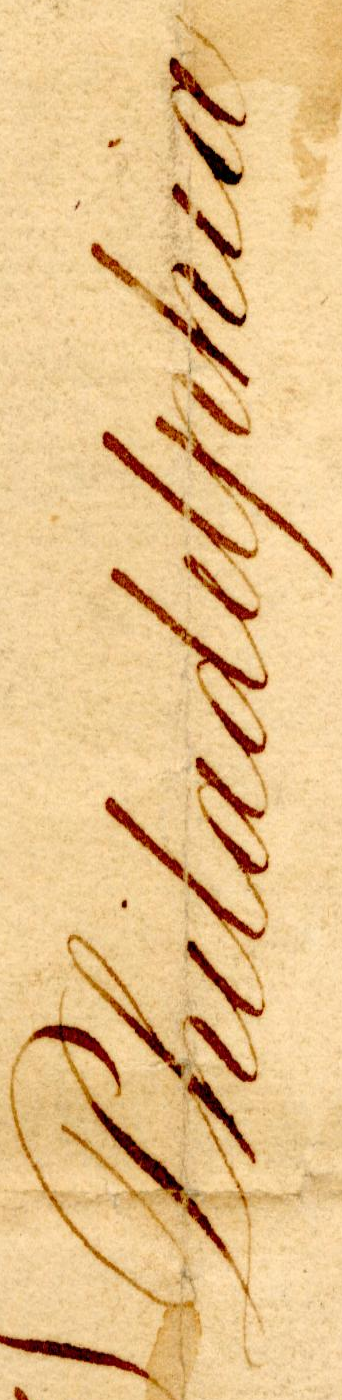Philadelphia
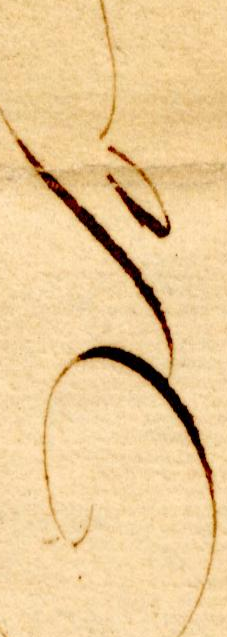To
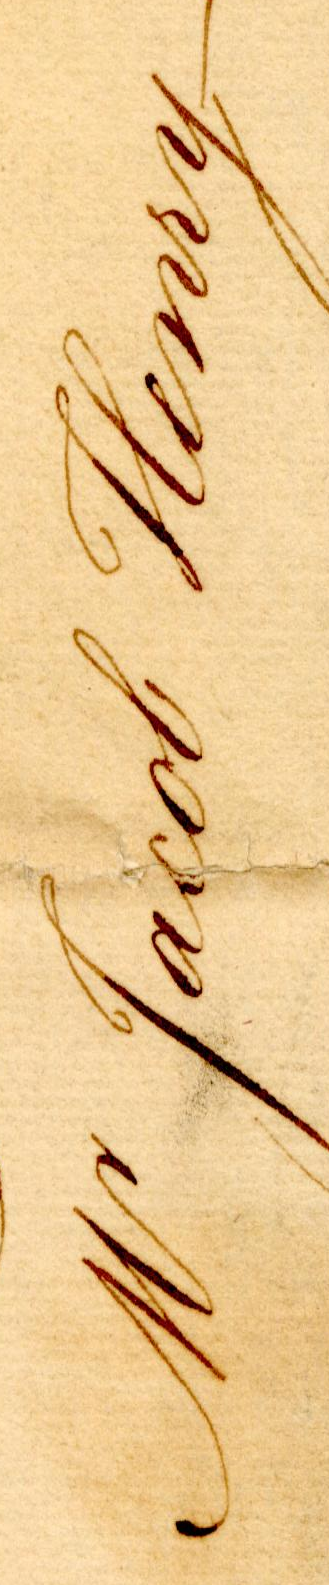M^r Jacob Henry
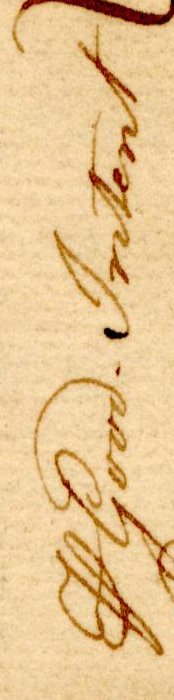per Good. Intent
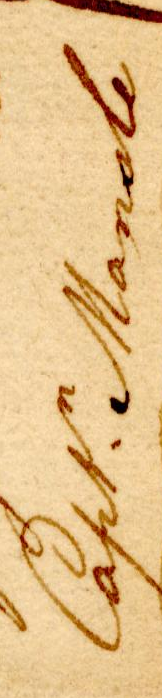Capt^n. Manole
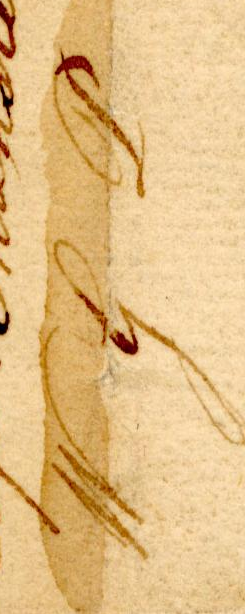W G P
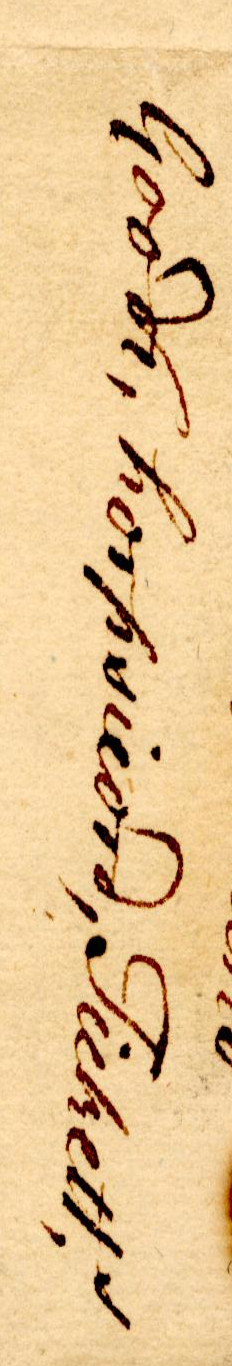Goods, horpsicord, Tickett,^s
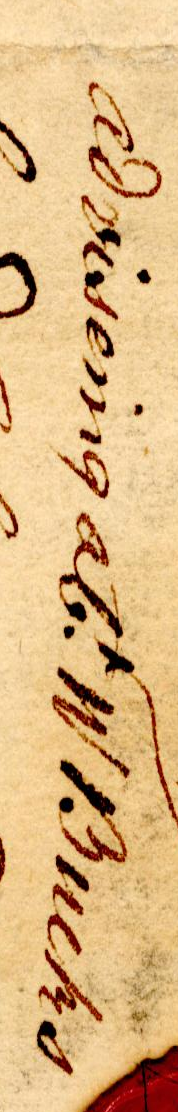adviseing ab^t. W Bucks
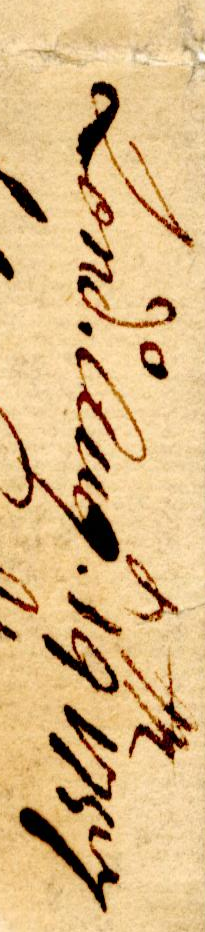Lond^o. Aug^t. 19^th 1757
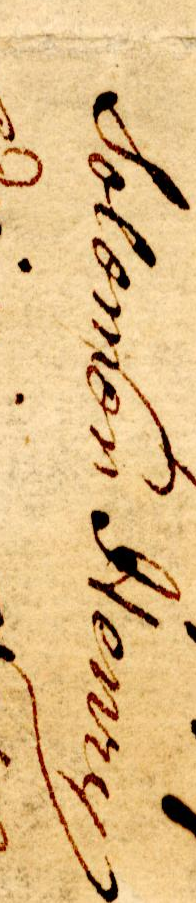Solomon Henry
